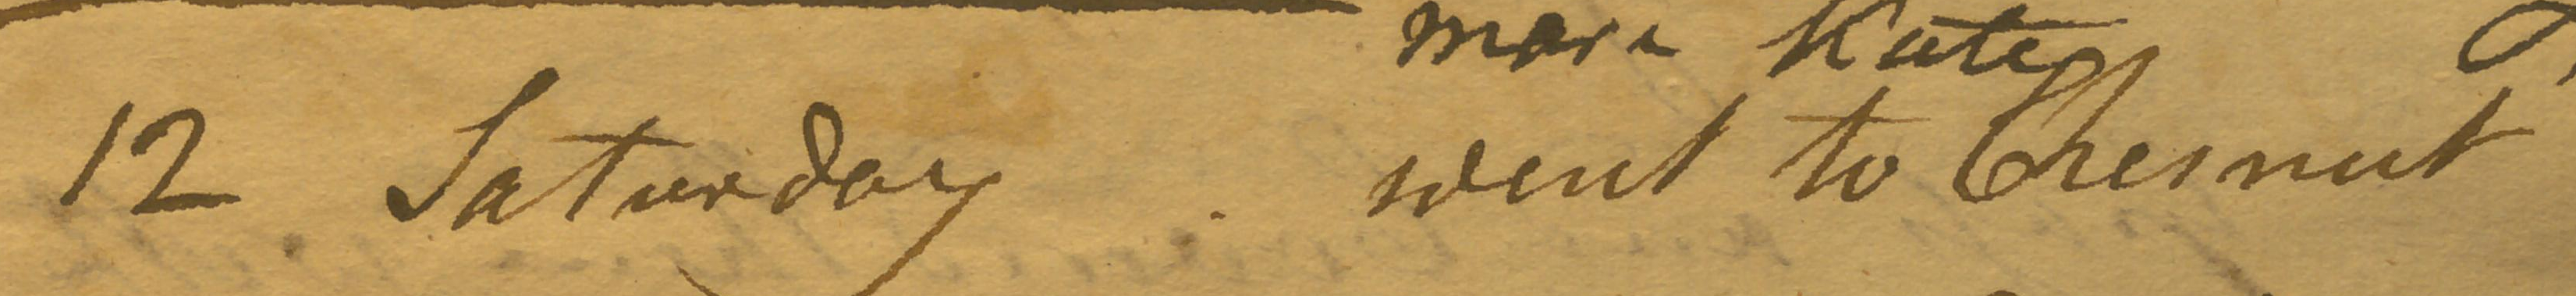12 Saturday went to Chesnut
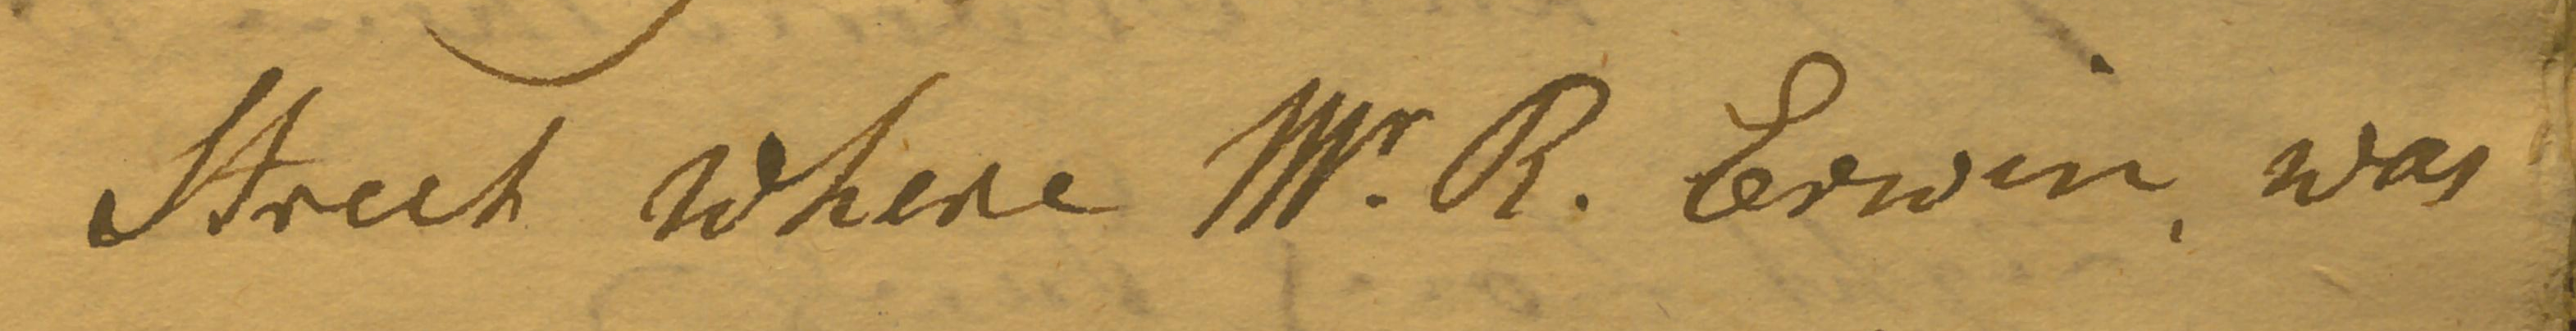Street where M^r. R. Erwin was
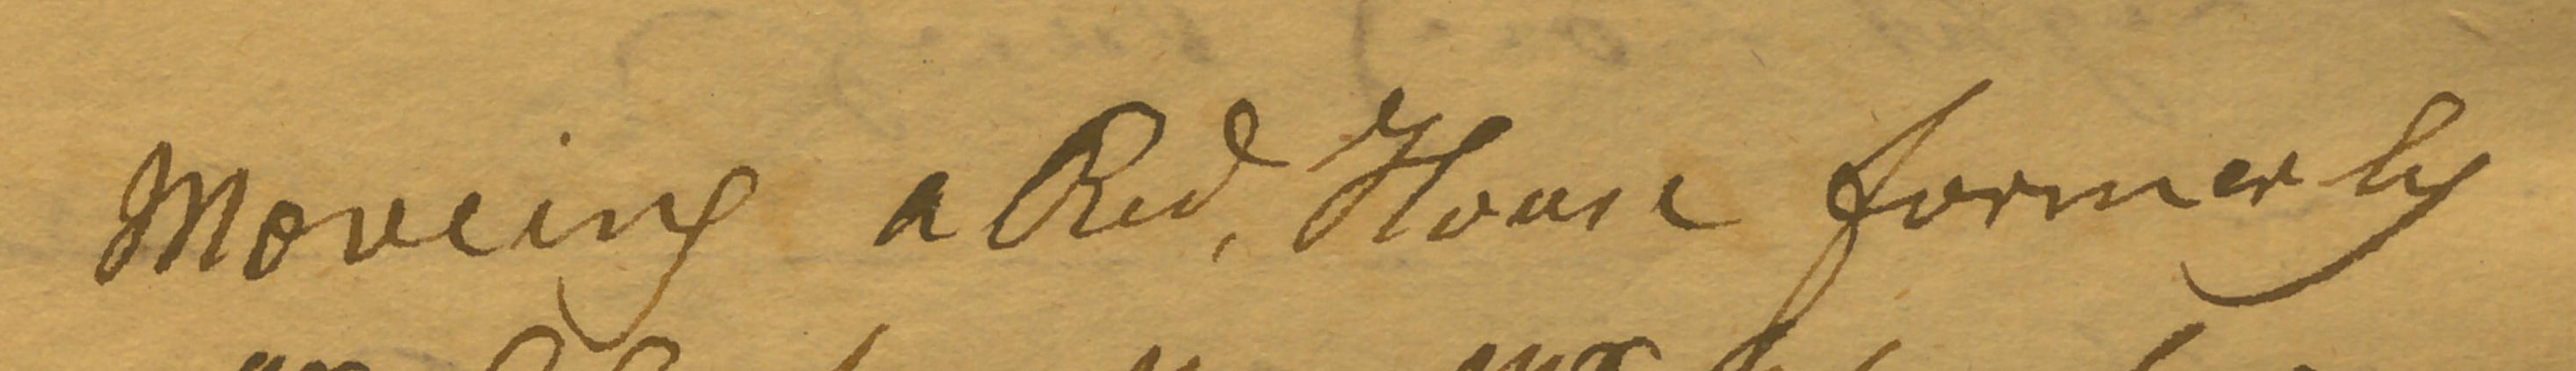Moveing a Red House formerly
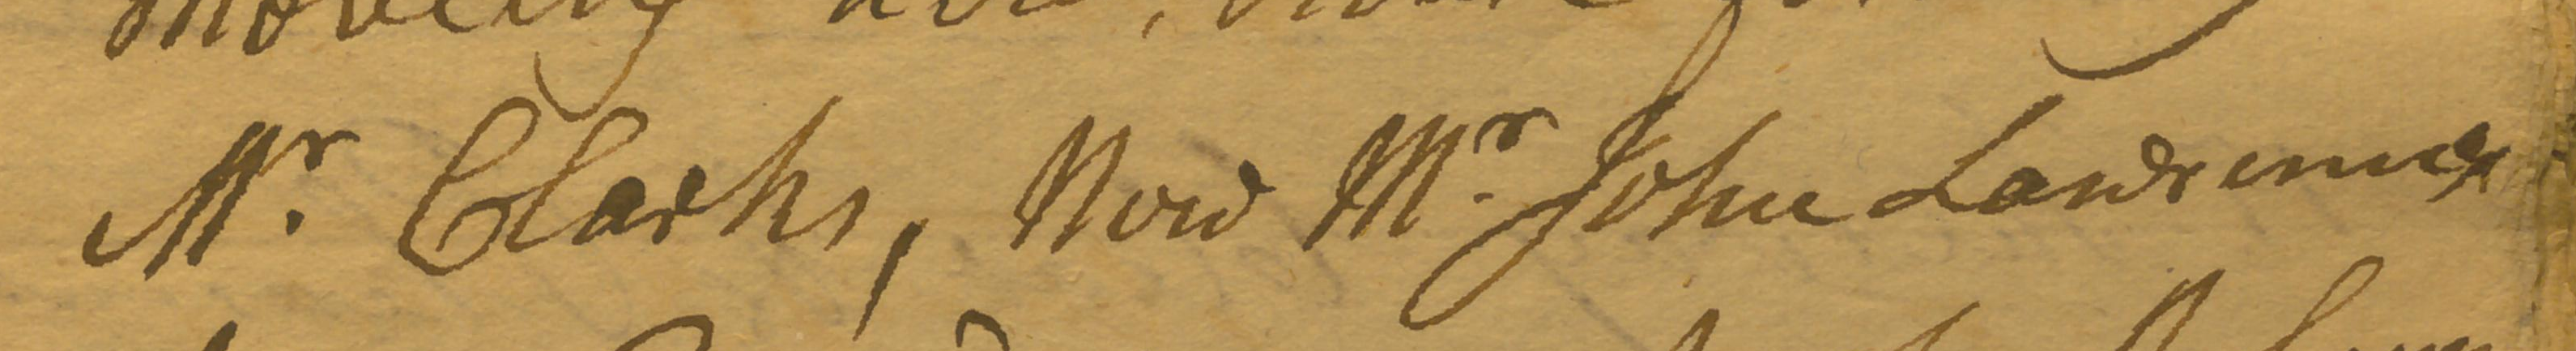M^r. Clarks, Now M^r. John Lawrence
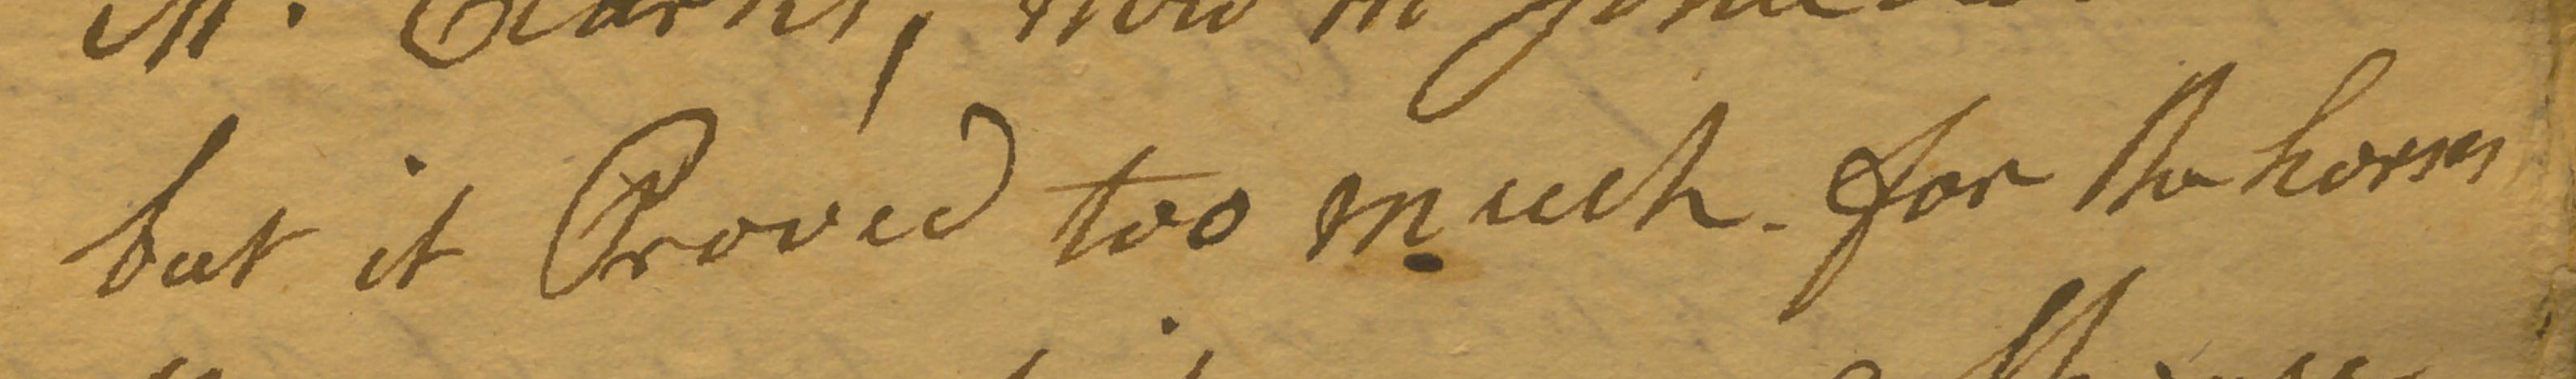but it Proved too much for the horses
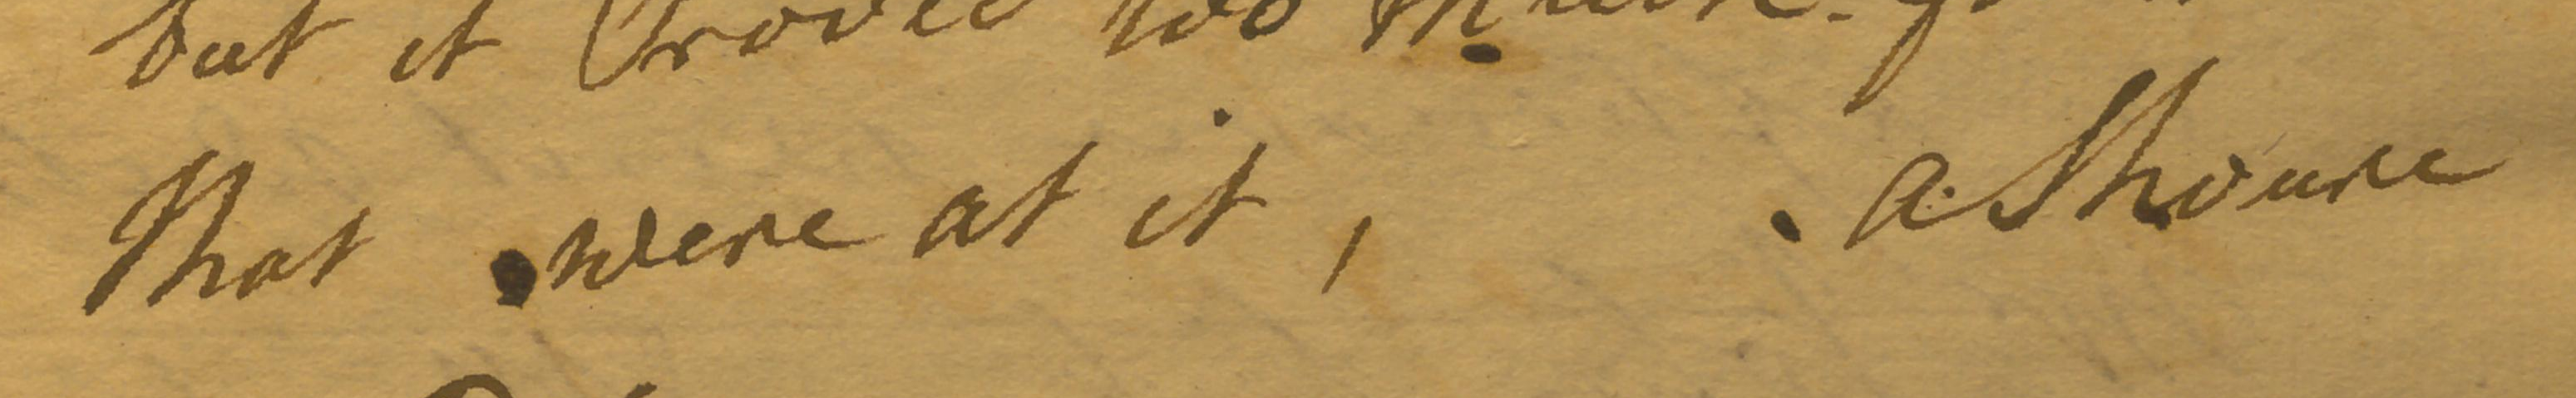that were at it, a Shoure
